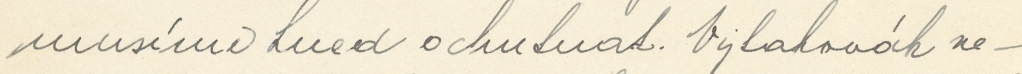musíme hned ochutnat. Vytahovák ne-
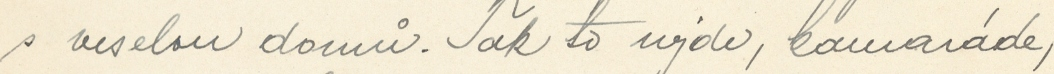s veselou domů. Tak to nejde, kamaráde,
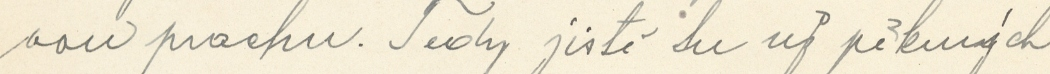vou prachu. Tedy jistě tu už pěkných
